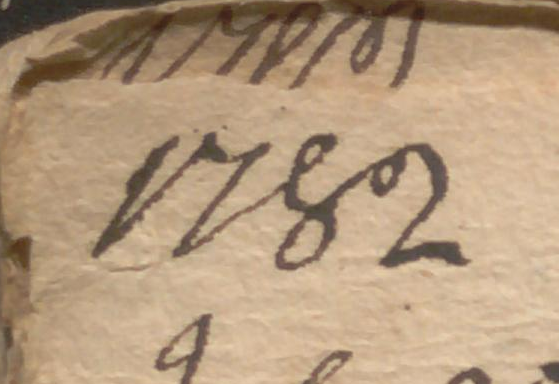1782
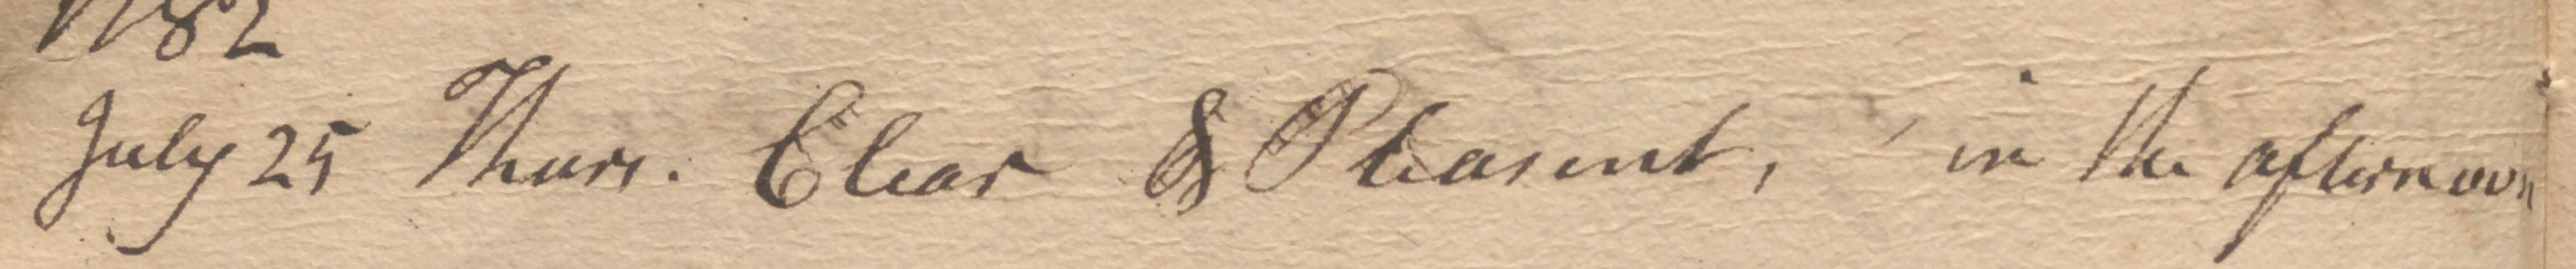July 25 Thurs. Clear & Pleasent, in the afternoon
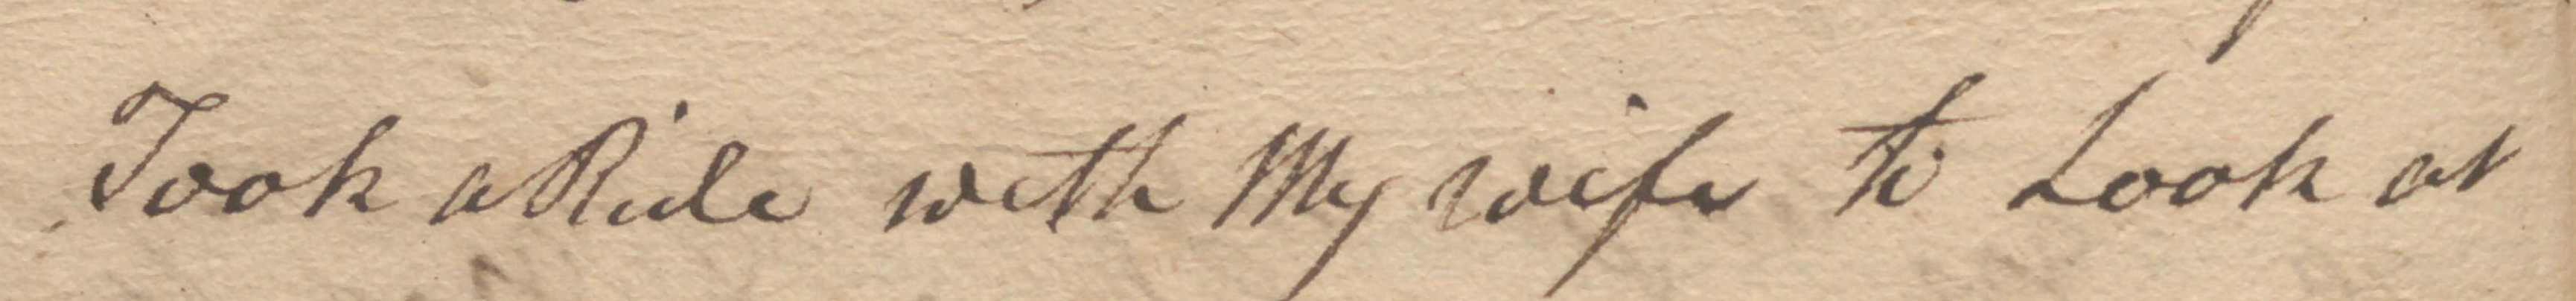Took a Ride with My wife to Look at
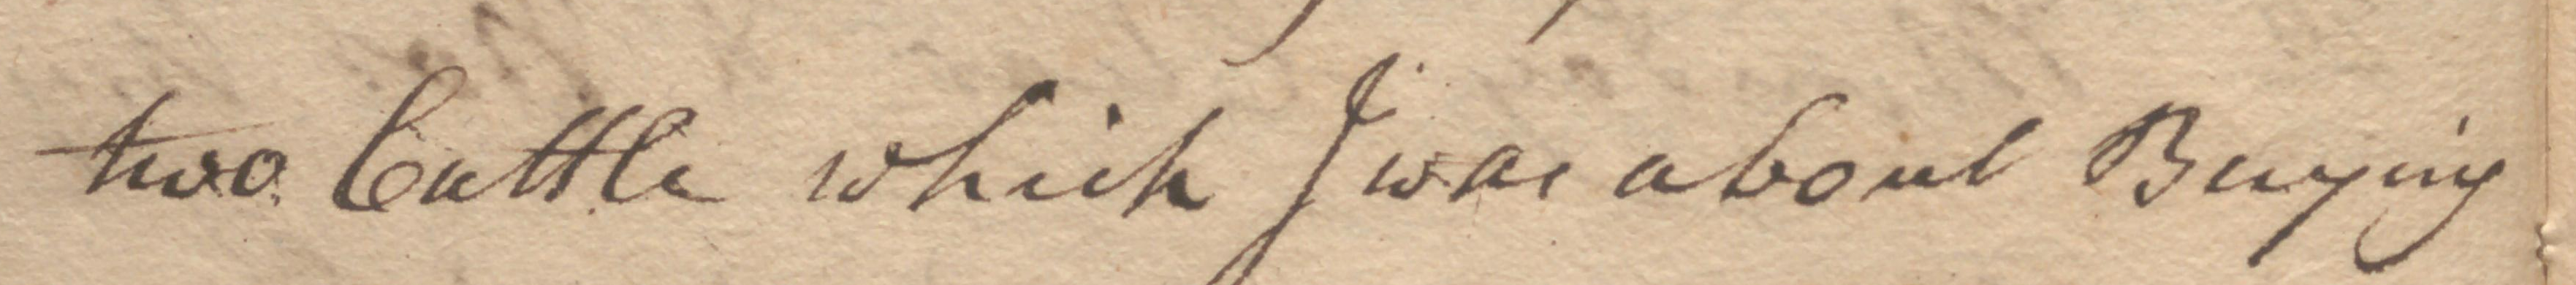two Cattle which I was about Buying
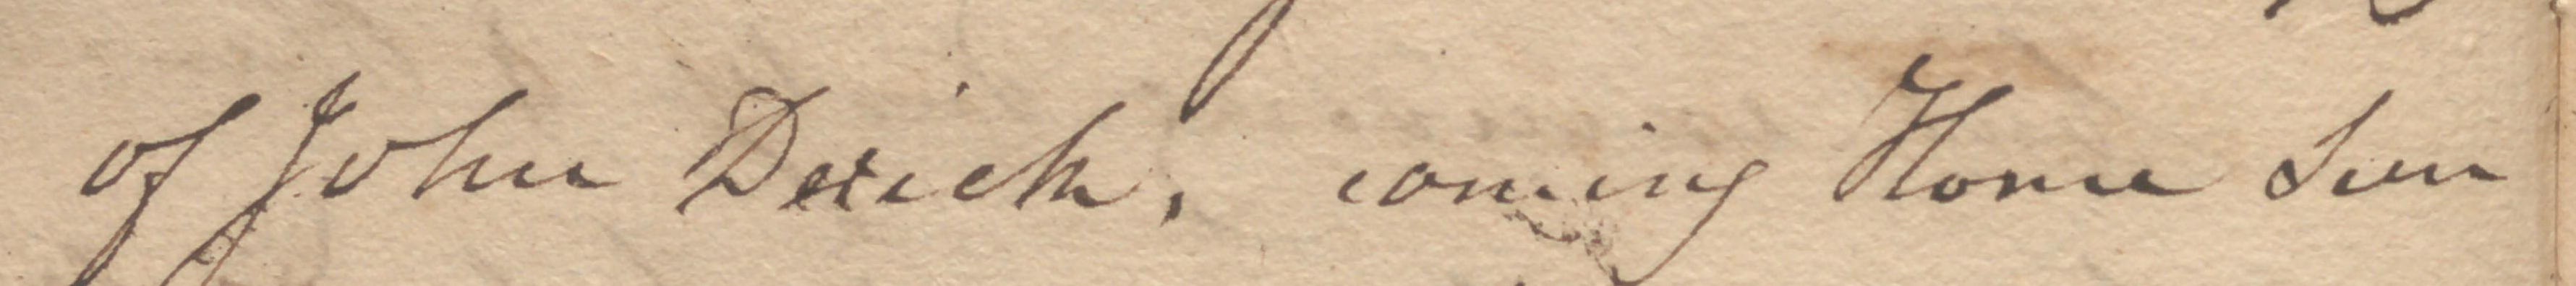of John Dereck. coming Home Seen
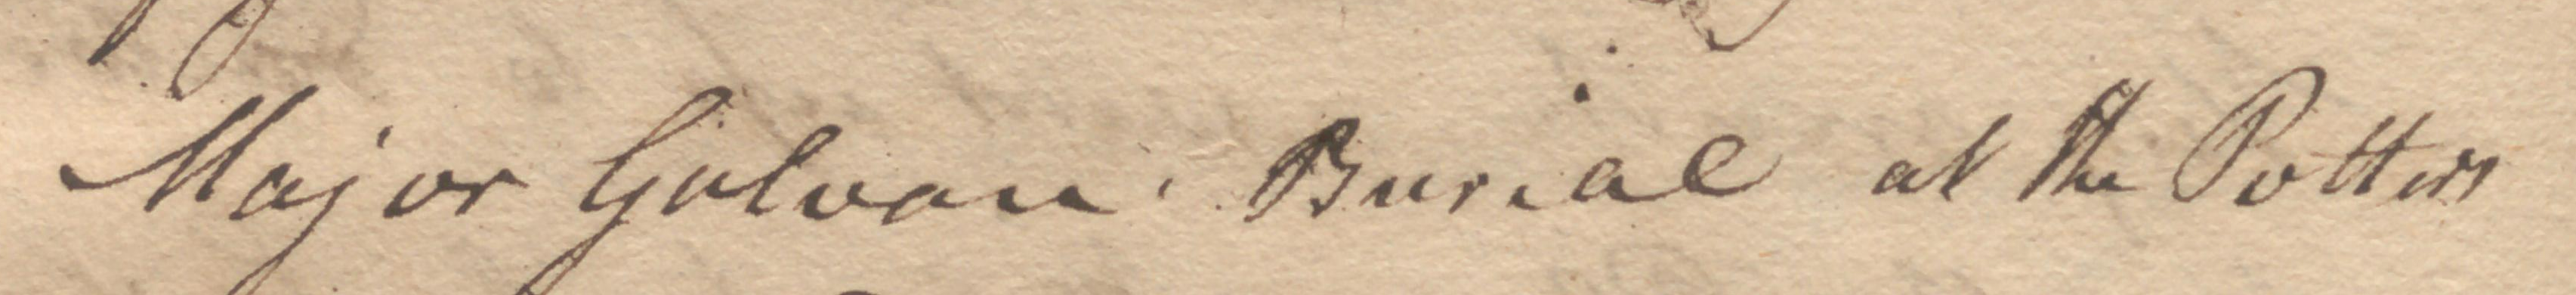Major Galvan Burial at the Potters
